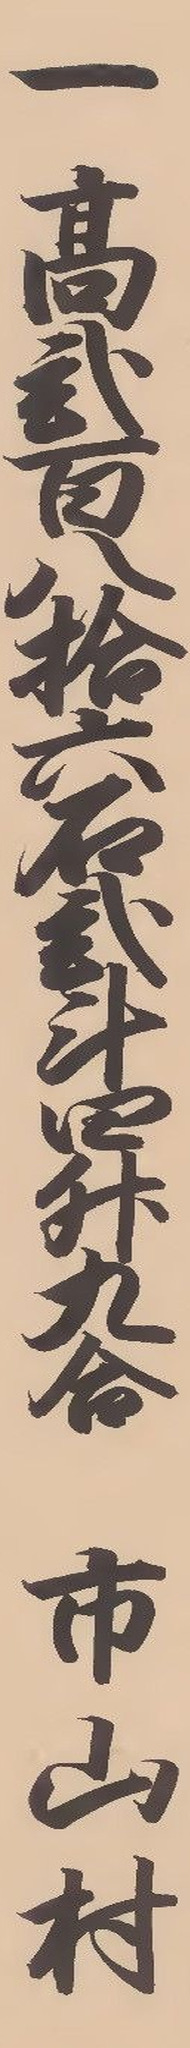一髙弐百八拾六石弐斗四升九合市山村
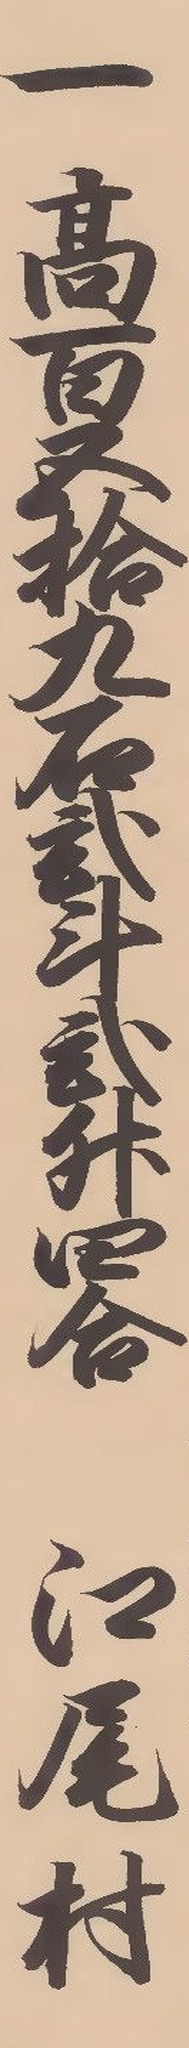一高百五拾九石弐斗弐升四合江尾村
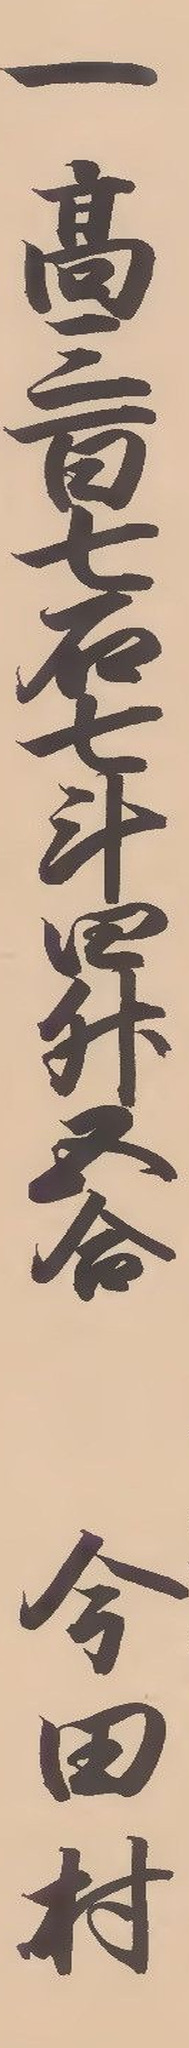一髙三百七石七斗四升五合今田村

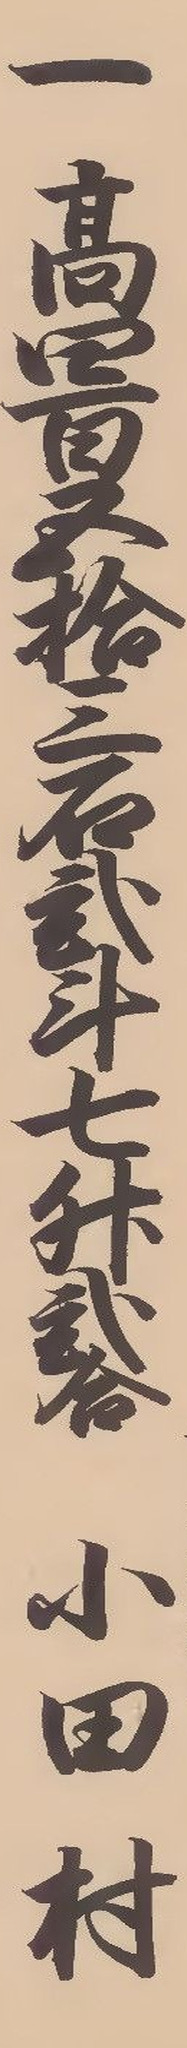一髙四百五拾三石弐斗七升弐合小田村
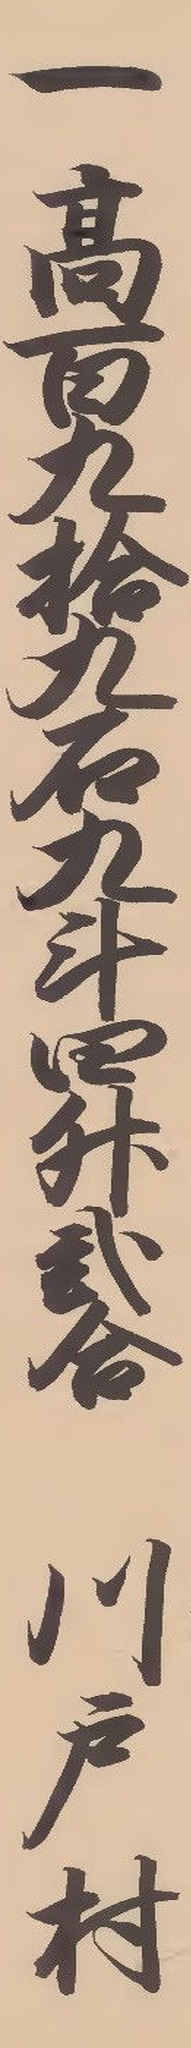一髙百九拾九石九斗四升弐合川戸村
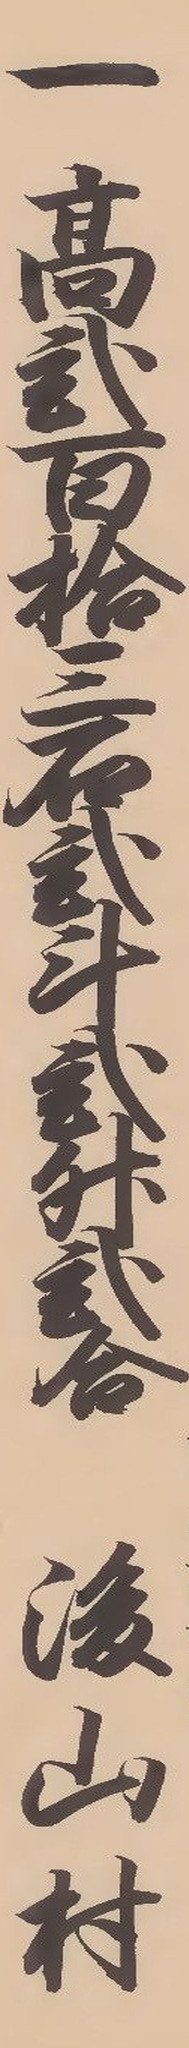一髙弐百拾三石弐斗弐升弐合後山村
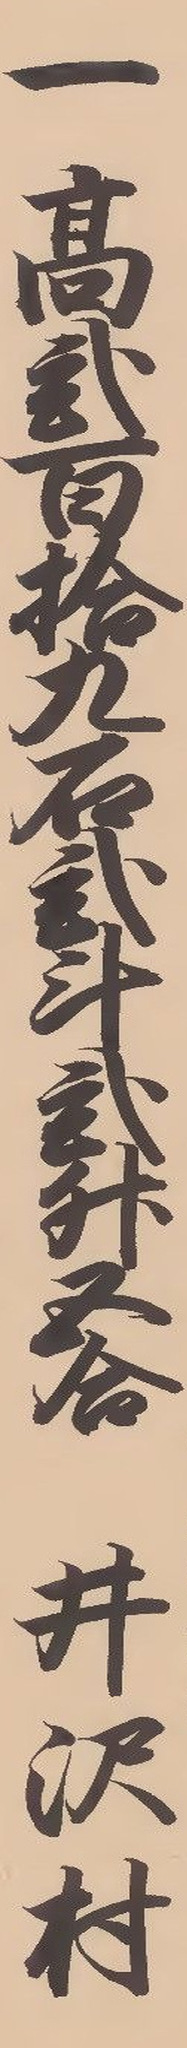一髙弐百拾九石弐斗弐升五合井沢村
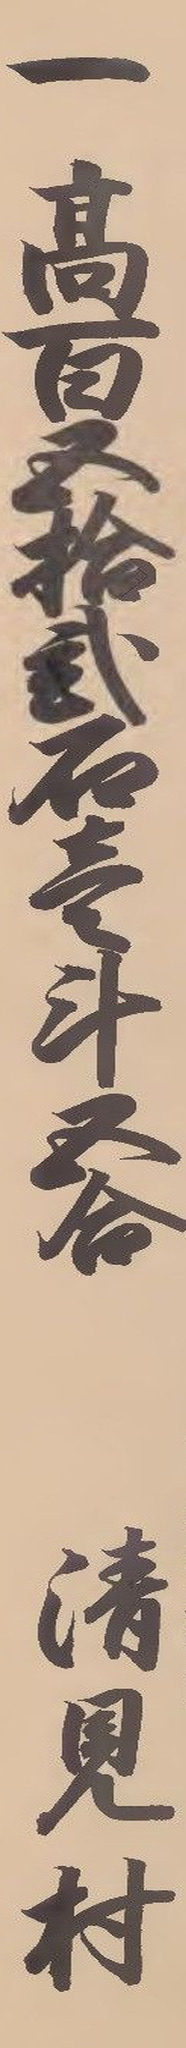一髙百五拾弐石壱斗五合清見村
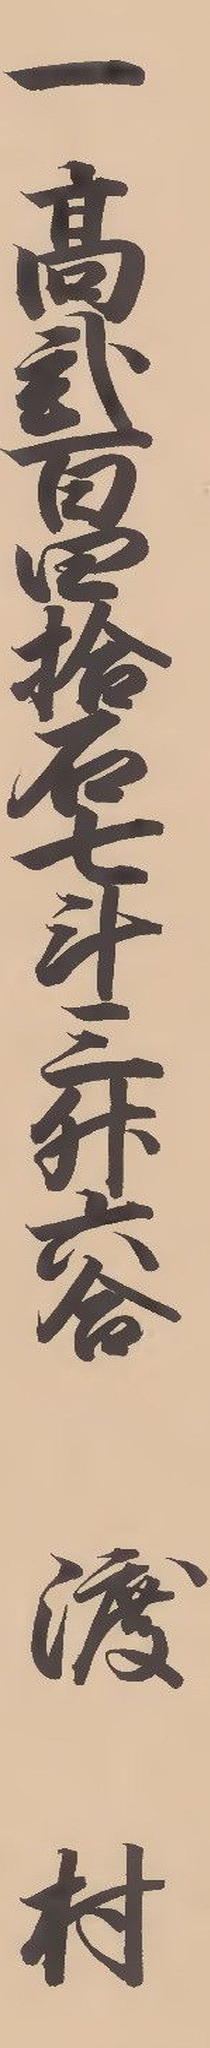一髙弐百四拾石七斗三升六合渡村
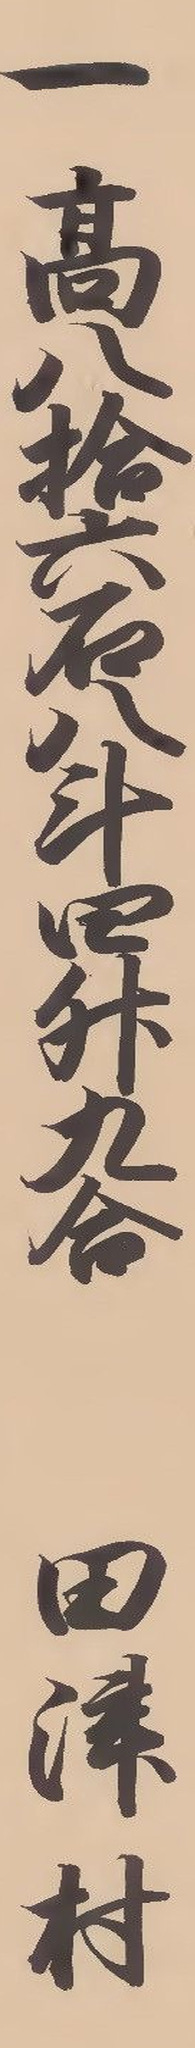一髙八拾六石八斗四升九合田津村
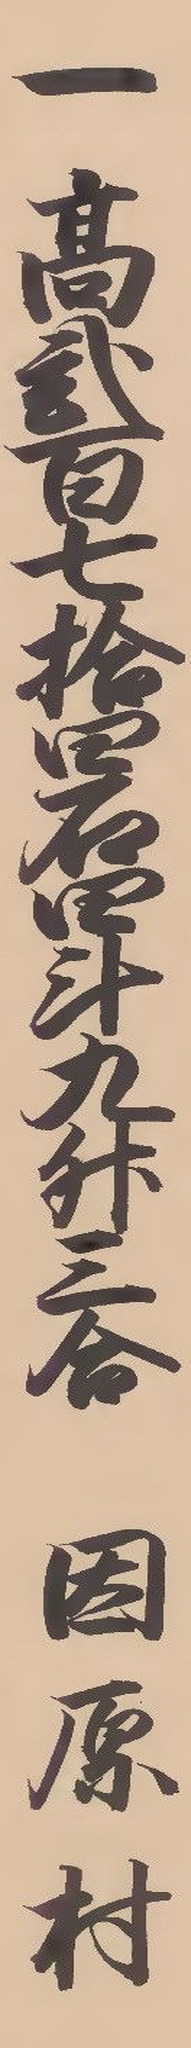一髙弐百七拾四石四斗九升三合因原村

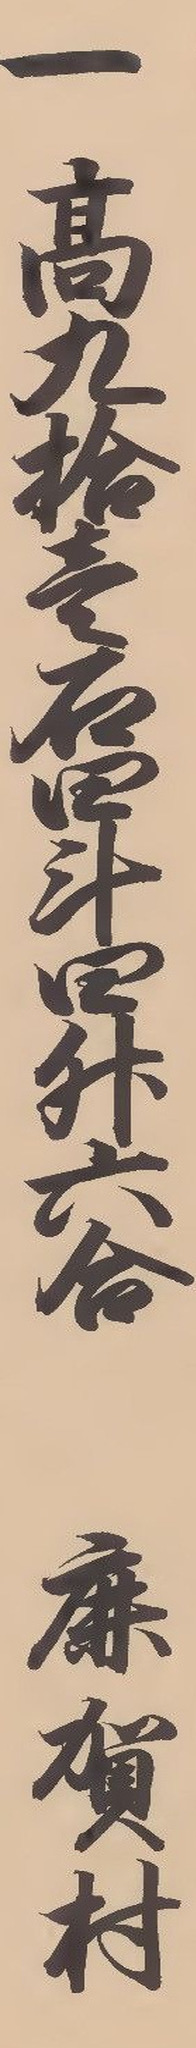一髙九拾壱石四斗四升六合鹿賀村
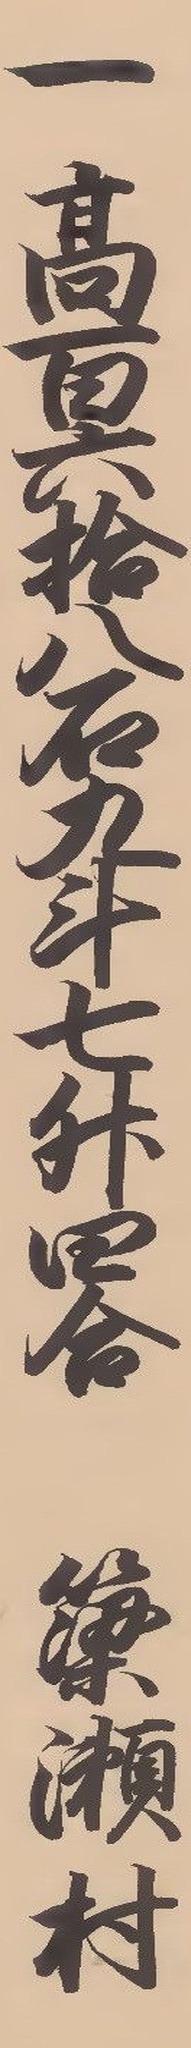一髙百六拾八石九斗七升四合簗瀬村
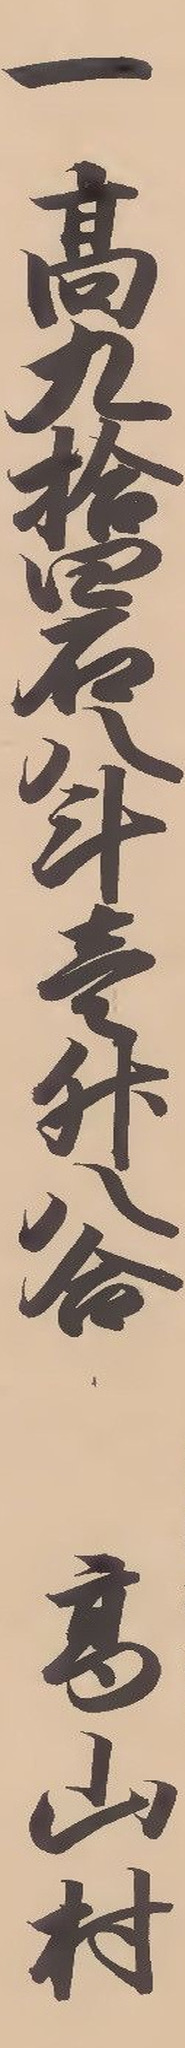一髙九拾四石八斗壱升八合髙山村
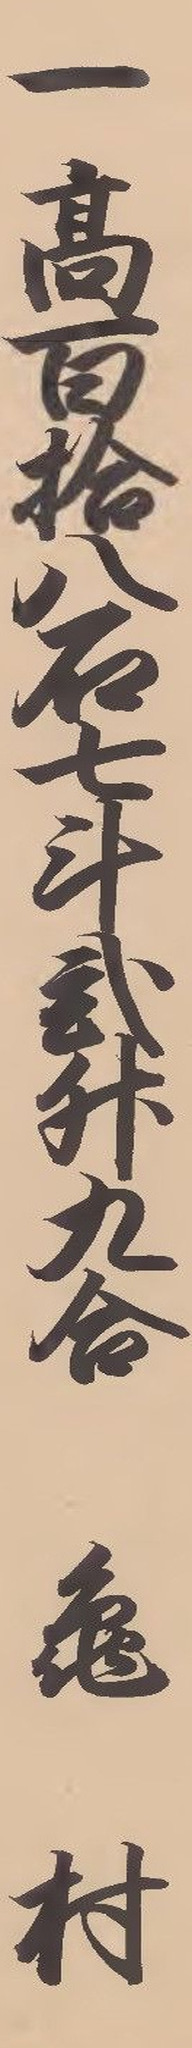一髙百拾八石七斗弐升九合龜村
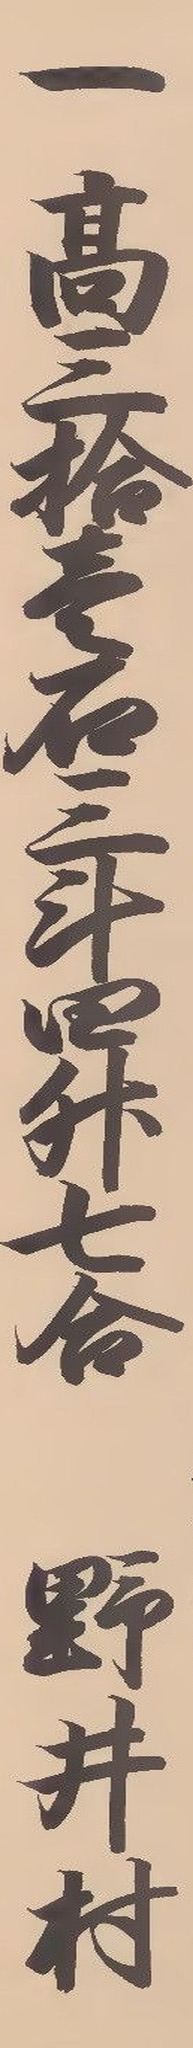一髙三拾壱石三斗四升七合野井村
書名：石見国郷帳
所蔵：国立公文書館 National Archives of Japan
